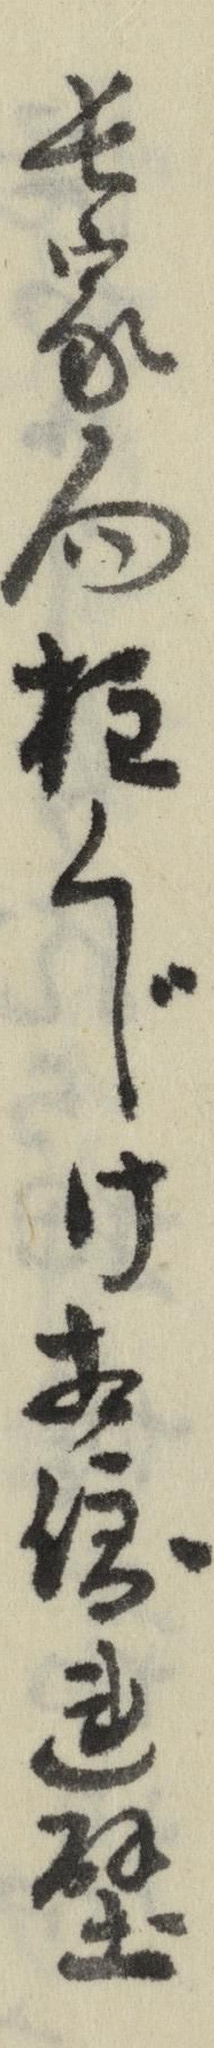長家向柱くじけ相倒れ壁
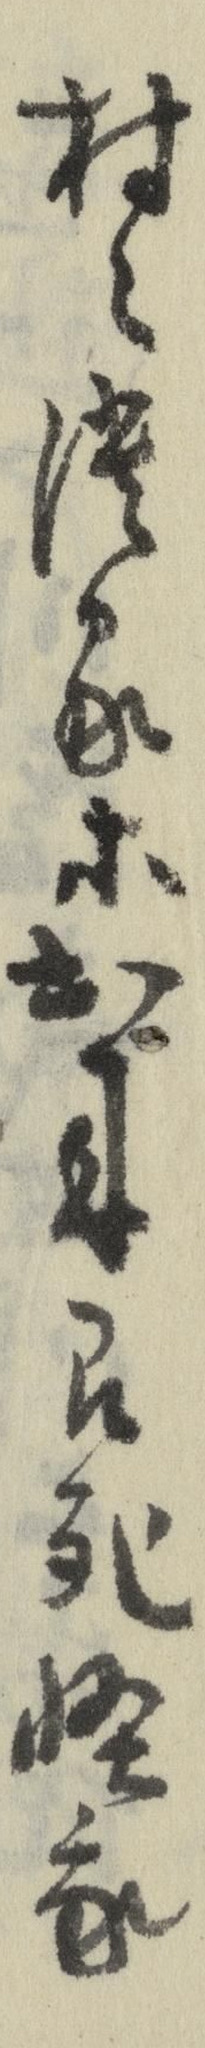村々潰家等出来即死怪我
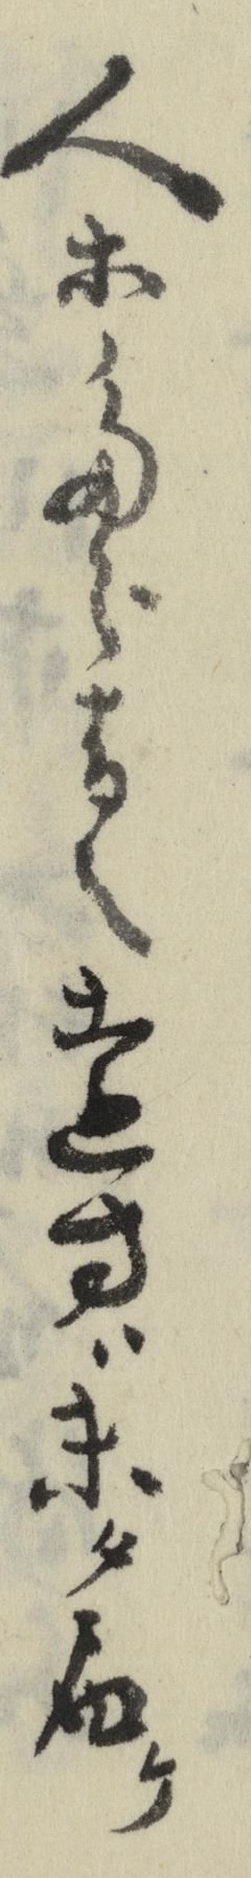人等多分有之遠方は未タ届ヶ
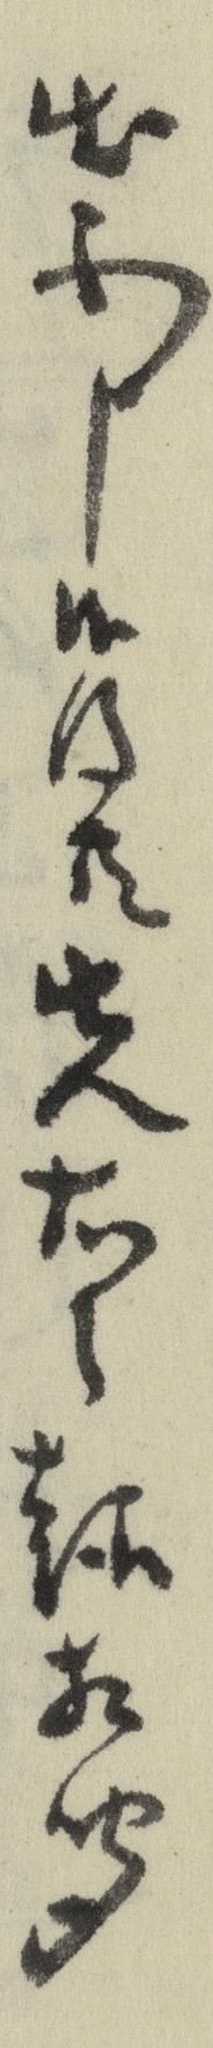出不申候得共先右之趣相聞
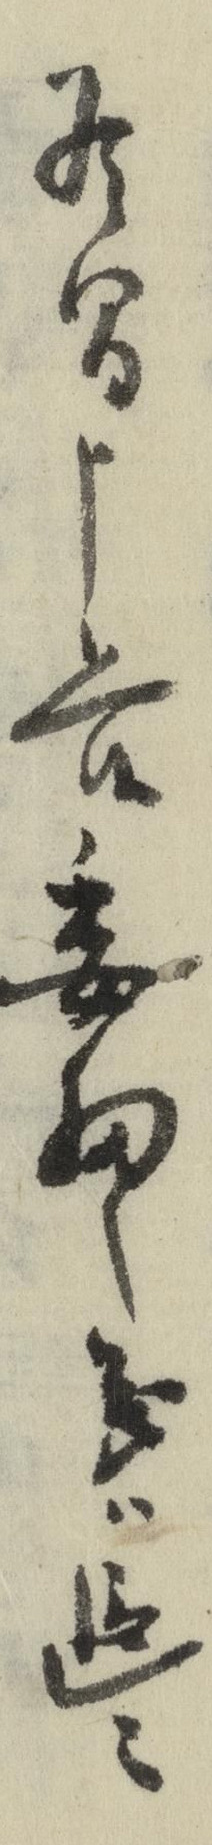候間申上候委細之義は追々
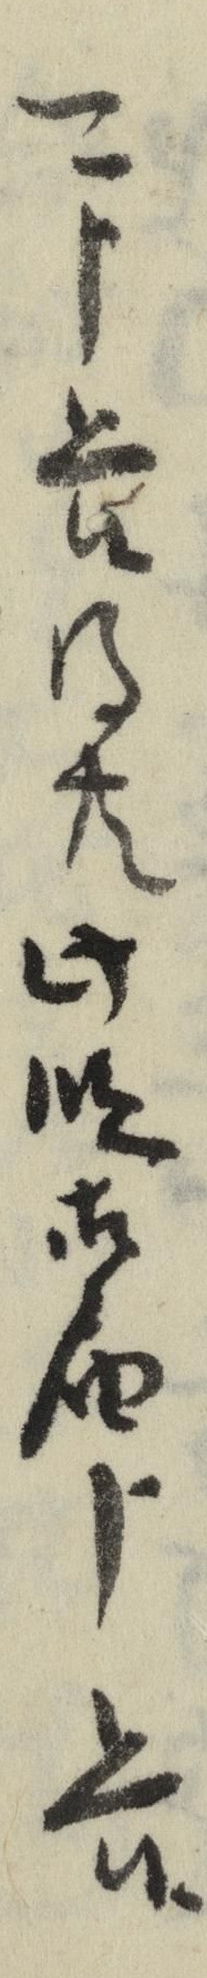可申上候得共此段御届申上候
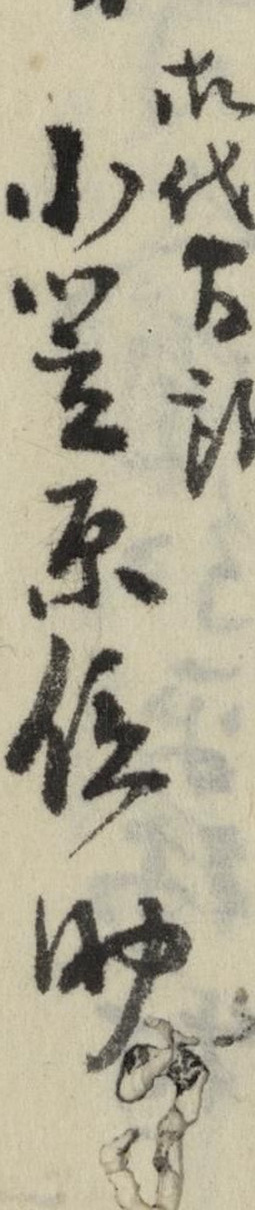小笠原信助

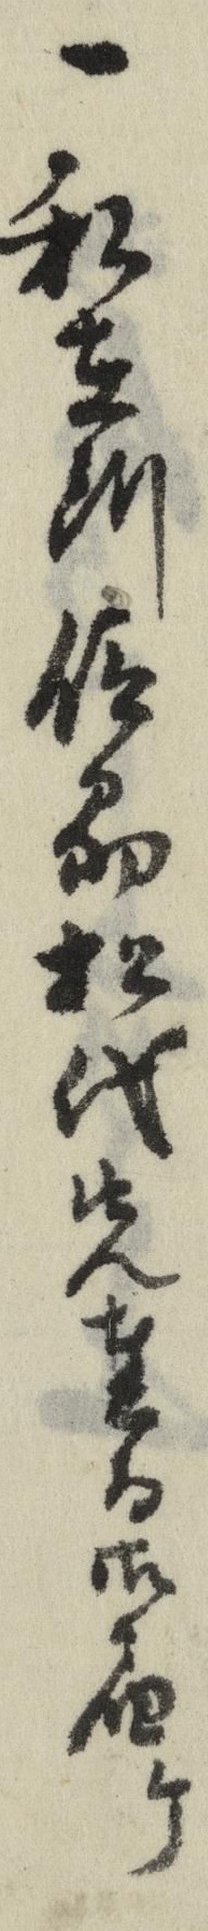一私在所信州松代先達而先御届
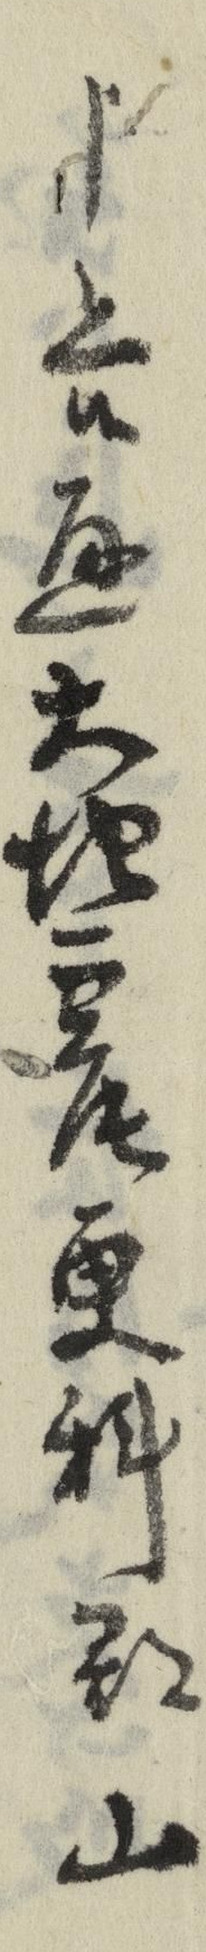申上候通大地震更科郡山
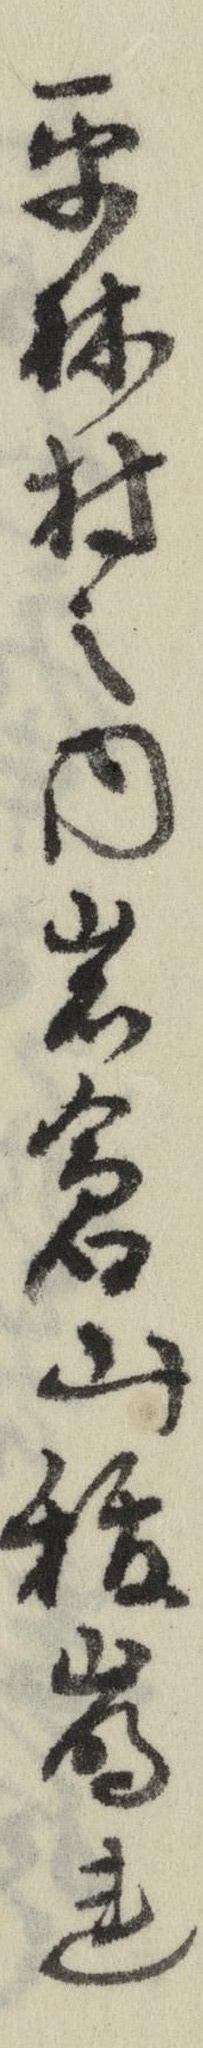平林村之内岩倉山抜崩れ
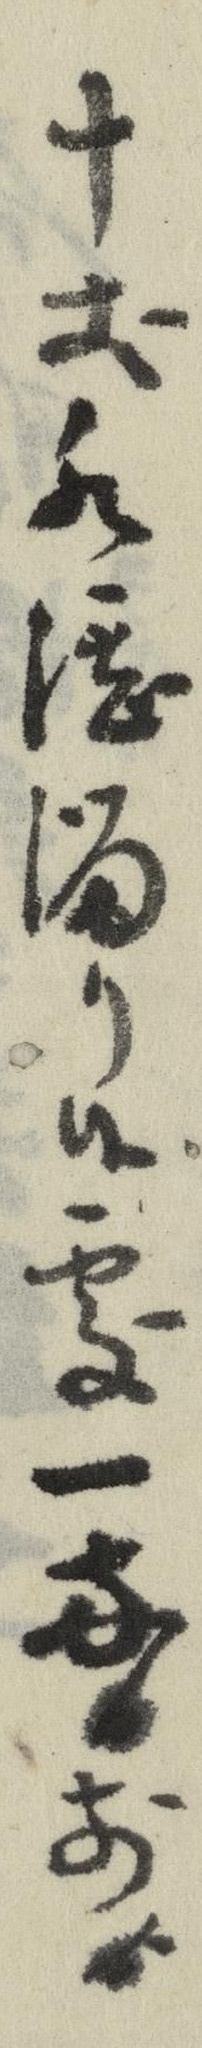十丈水湛溜り候処一両日前ゟ
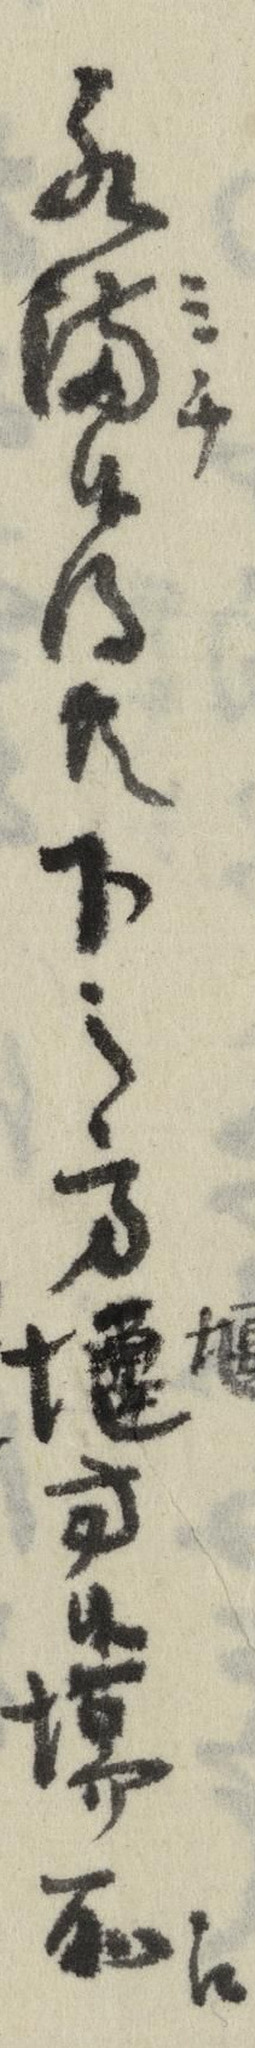水満候得共下之方堰方候場所江
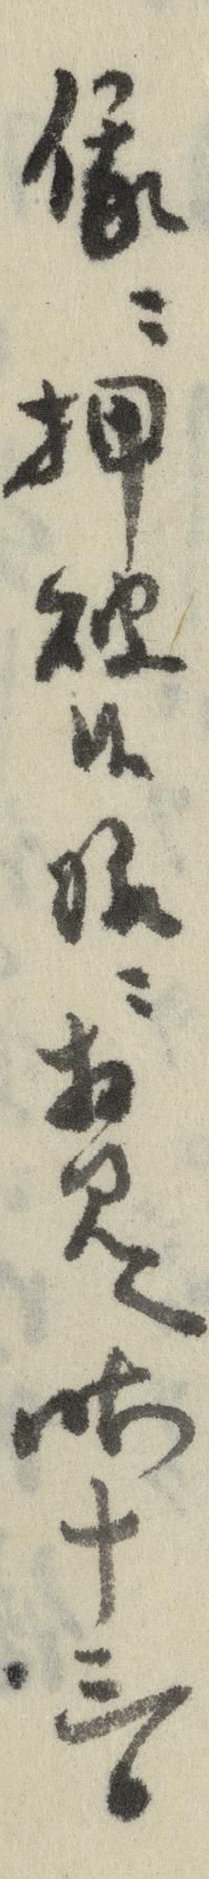俄二押破候様二相見へ昨十三日
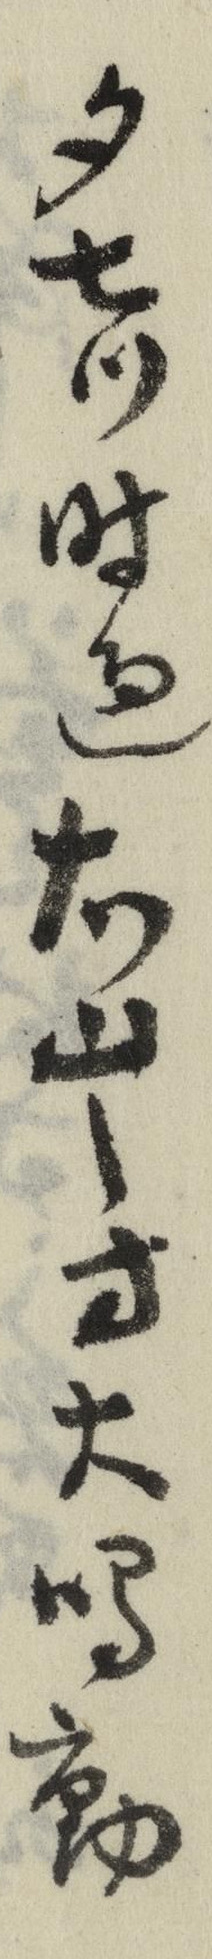夕七ツ時過右山之方大鳴動
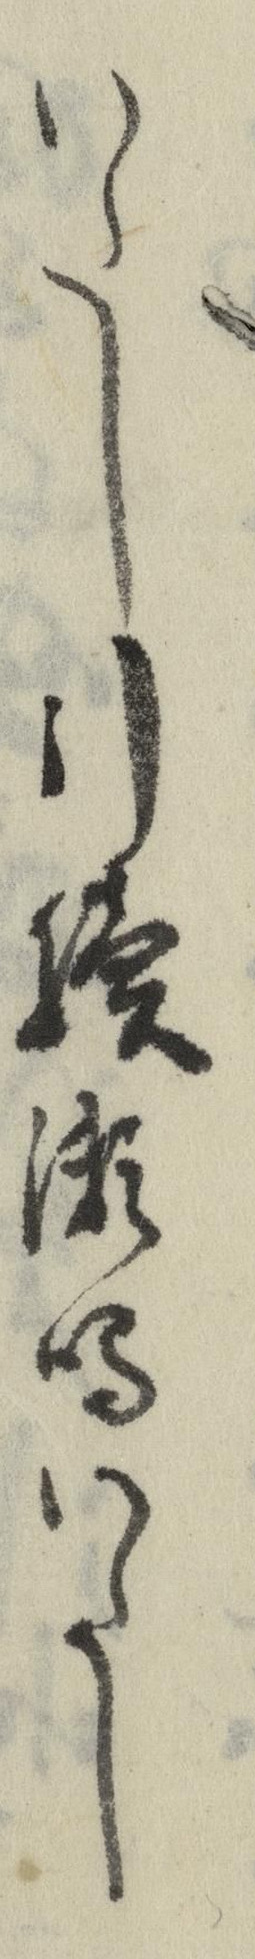いたし引続瀬鳴いたし
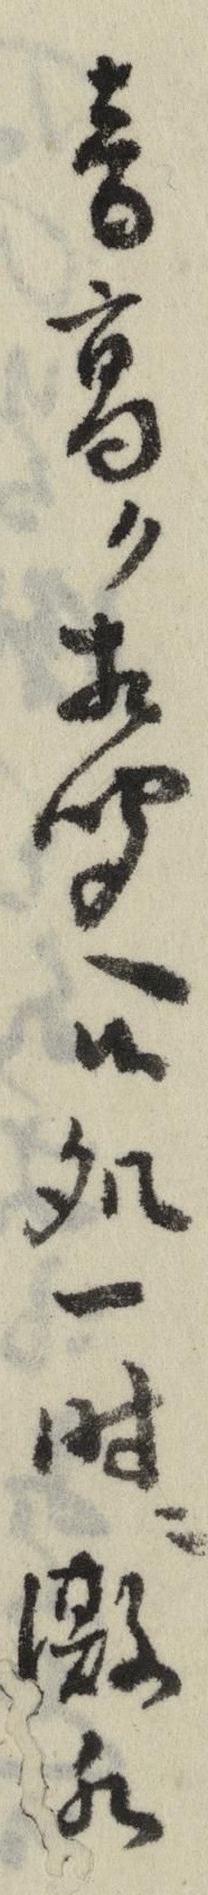高ク相聞へ候処一時二激水
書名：信州大地震一件之冩　丁未弘化四年三月吉日
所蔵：東京大学地震研究所図書室 Earthquake Research Institute Library, The University of Tokyo, JAPAN
